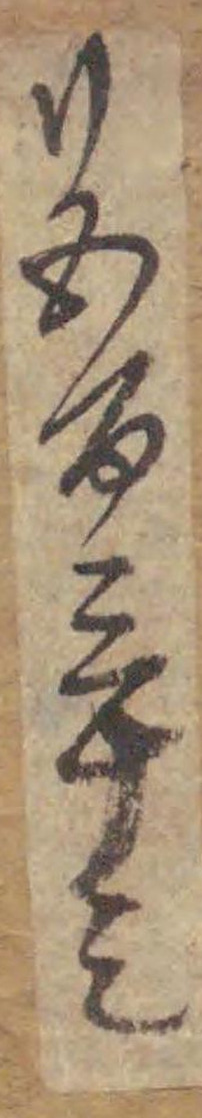り五百三十三

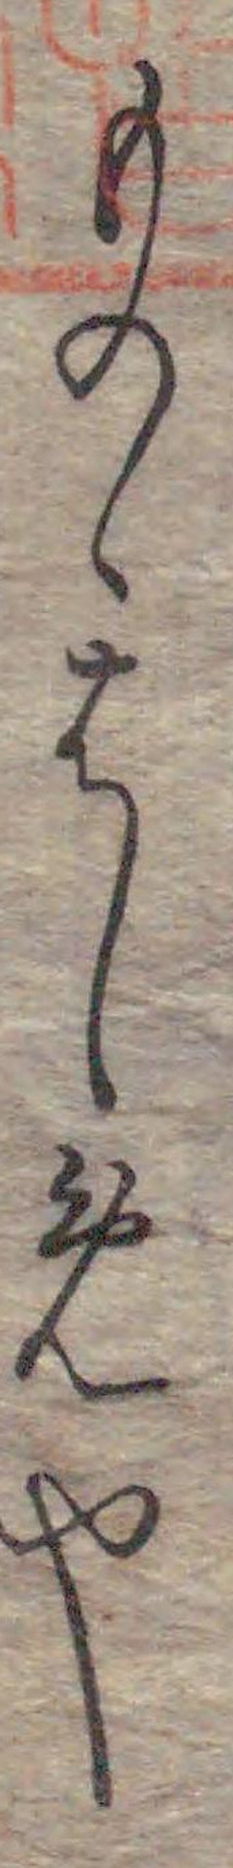ものゝはしめや
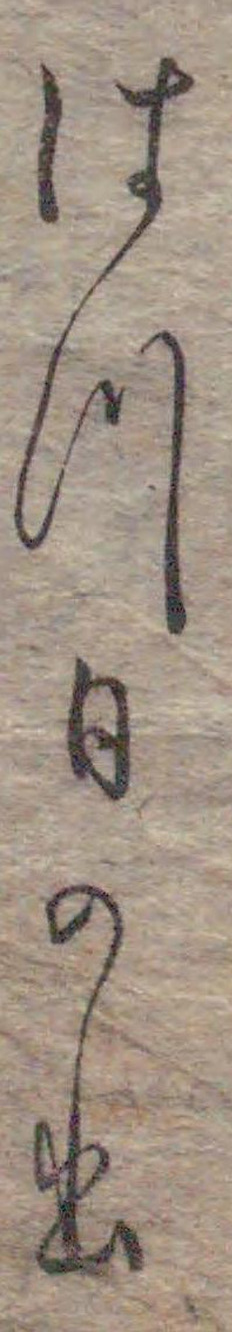はつ日の出
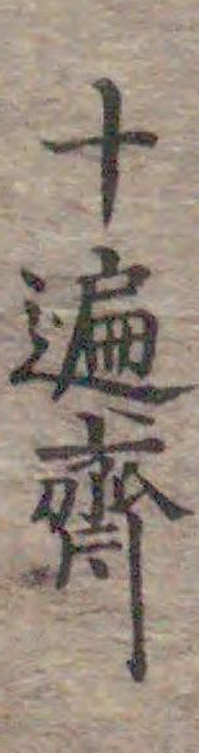十遍齊
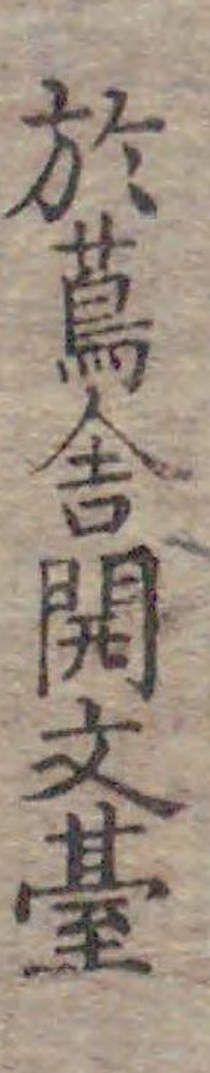於蔦舎開文䑓

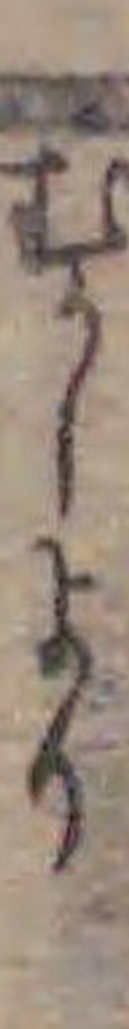むかしより
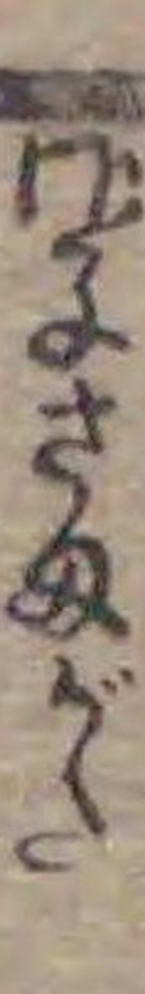御子さまがた
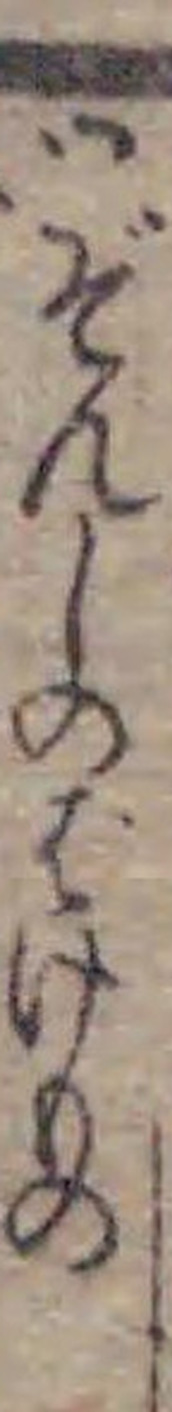御ぞんしのばけもの
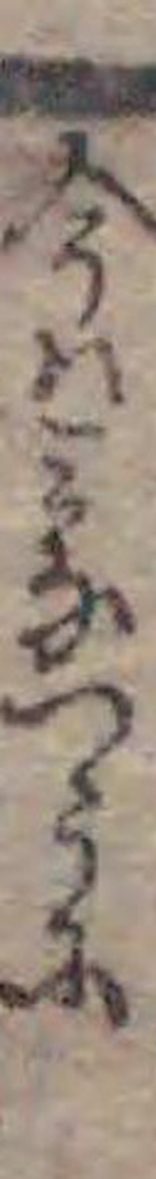今はみなつうに
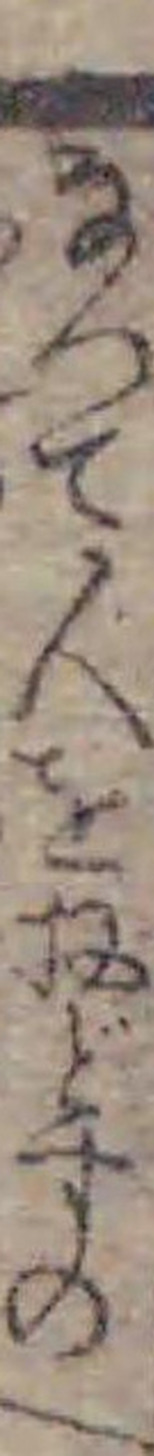なつて人をおどすの
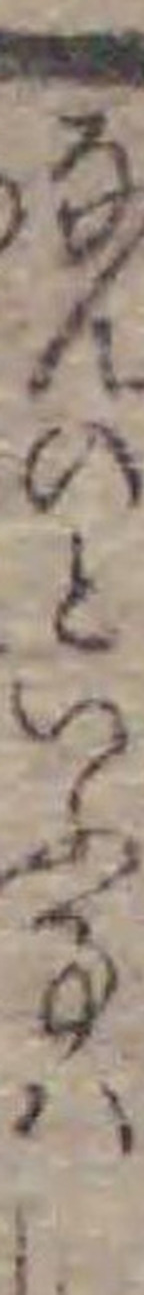なんのといふ事は
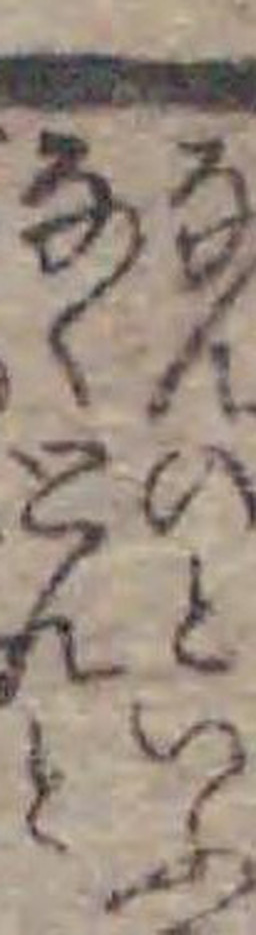なくとんと
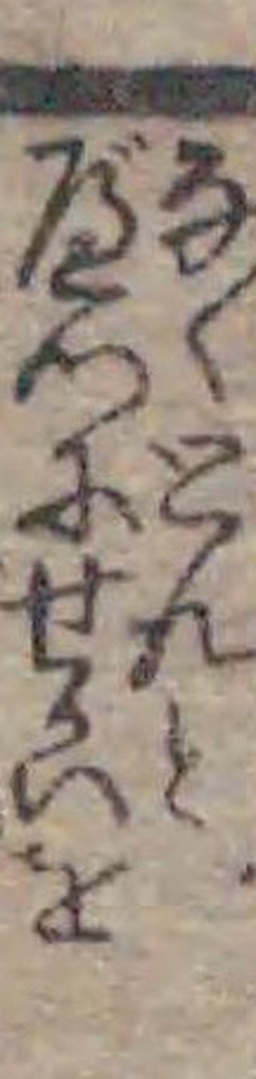べつにせかいを
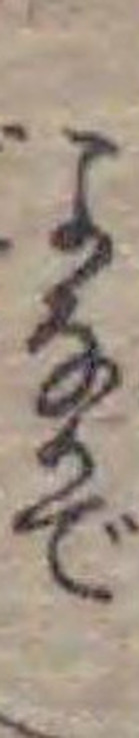よなかで
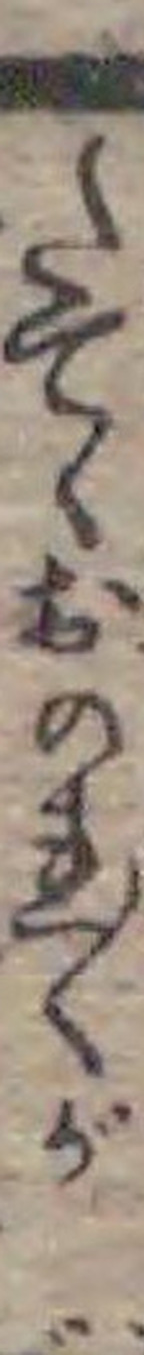たてゝおのれ〳〵が
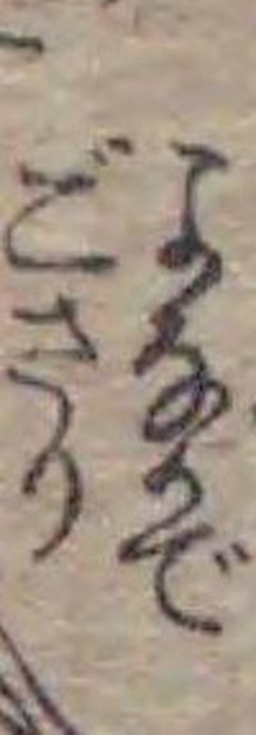ごさり
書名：年中行状記 : 2巻
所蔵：国立国会図書館 National Diet Library, JAPAN
